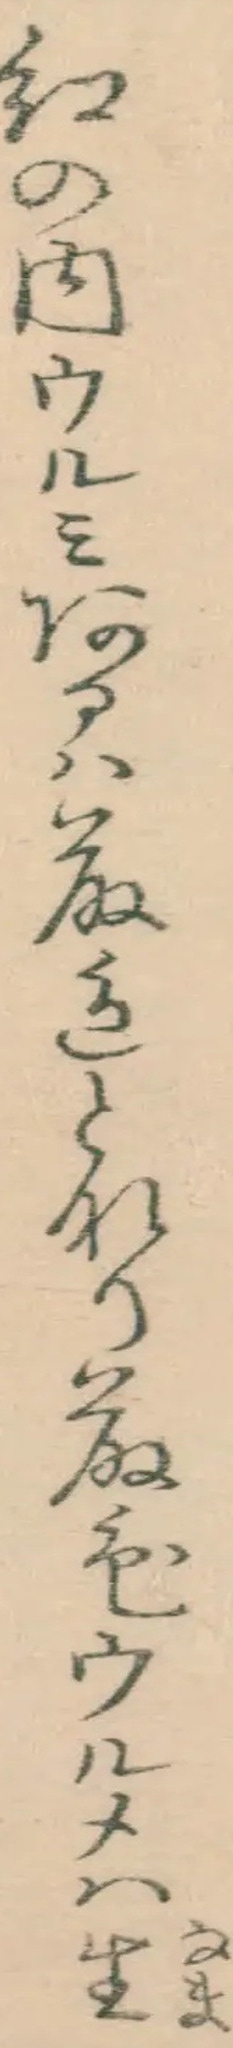紅の内ウルミあるは藤色となり藤色ウルメは生
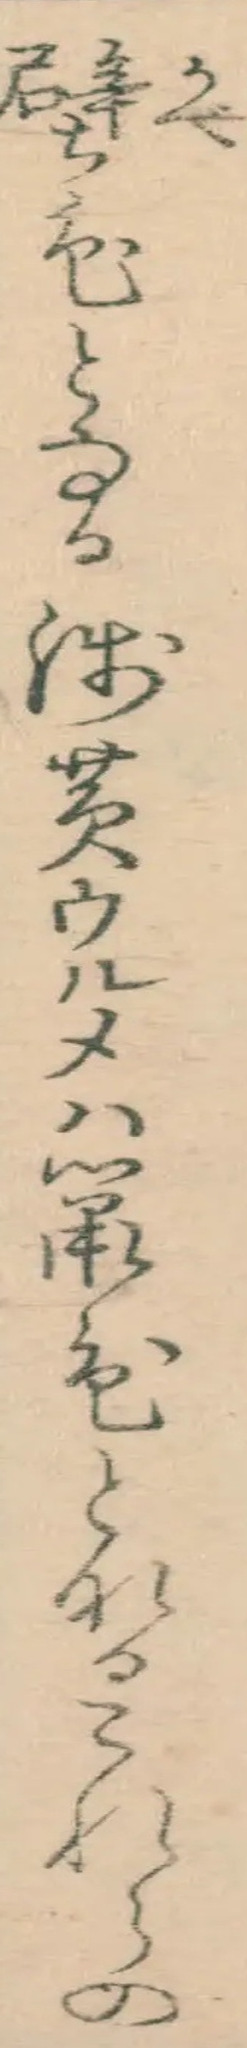壁色となる浅黄ウルメは鼠色となるこれらの
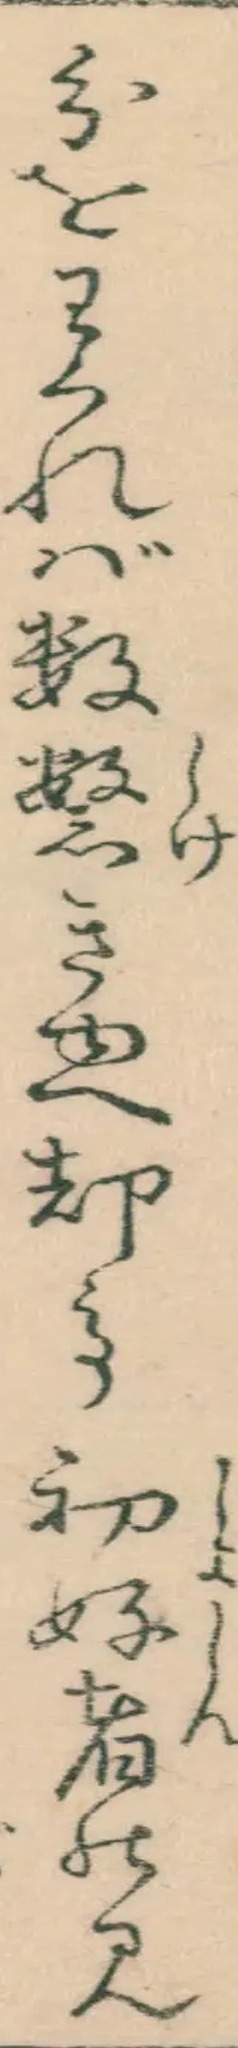分をわくれば数繁きゆへ却て初好者の見
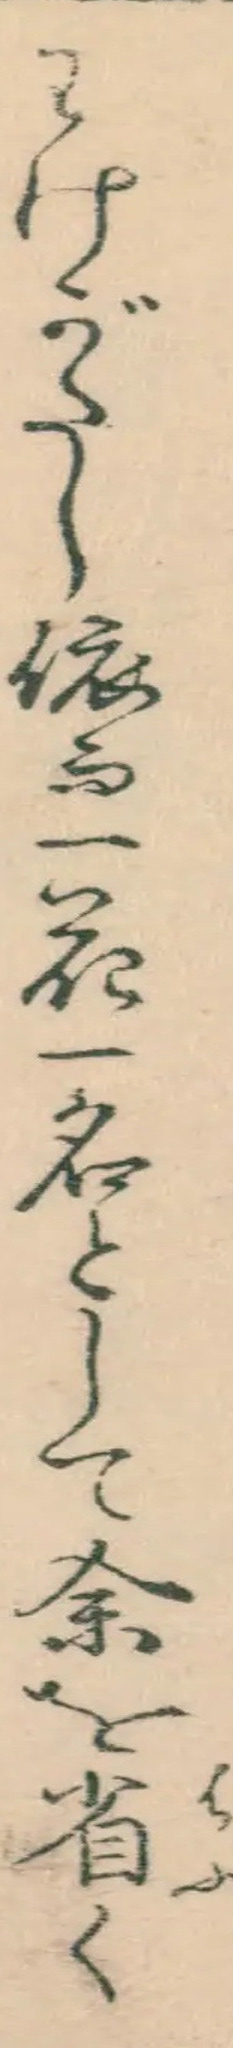わけがたし依而一花一名として余を省く
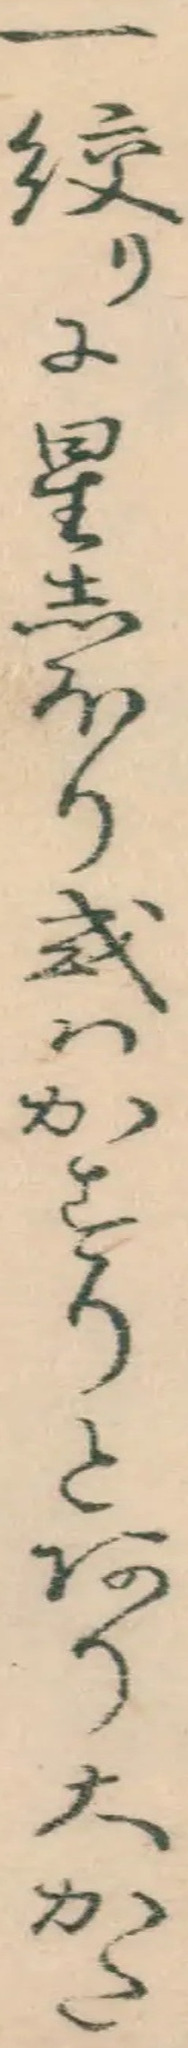一絞りに星しほり或はかすりとあり大かた
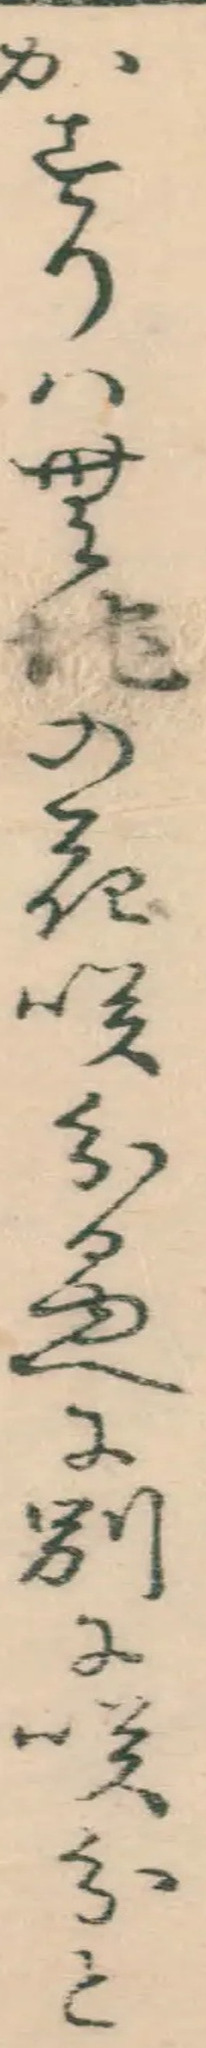かすりは無地の花咲分るゆへに別に咲分と
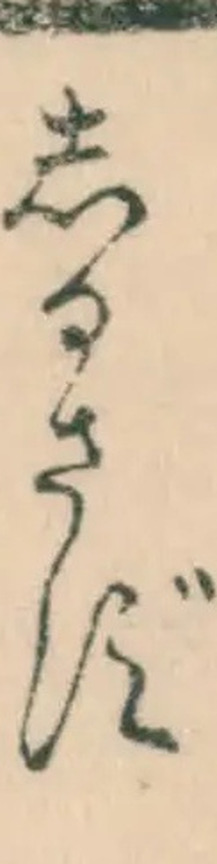しるさず
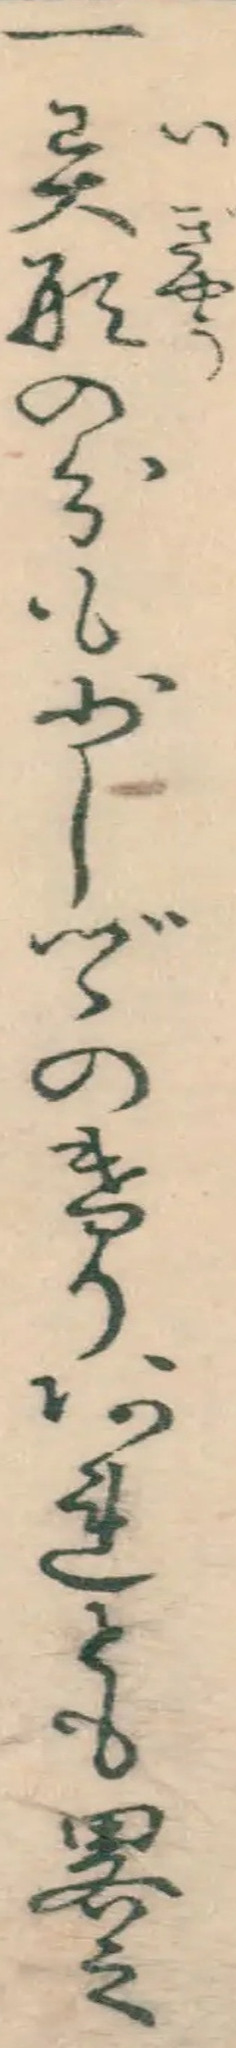一異形の分も少しづゝの替りあれとも略之
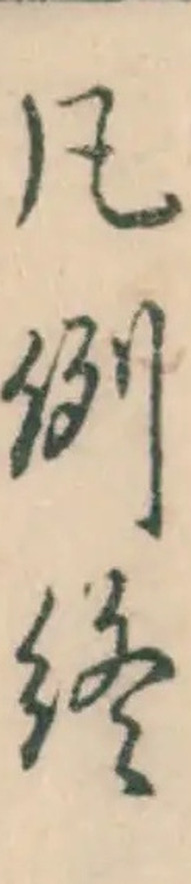凡例終

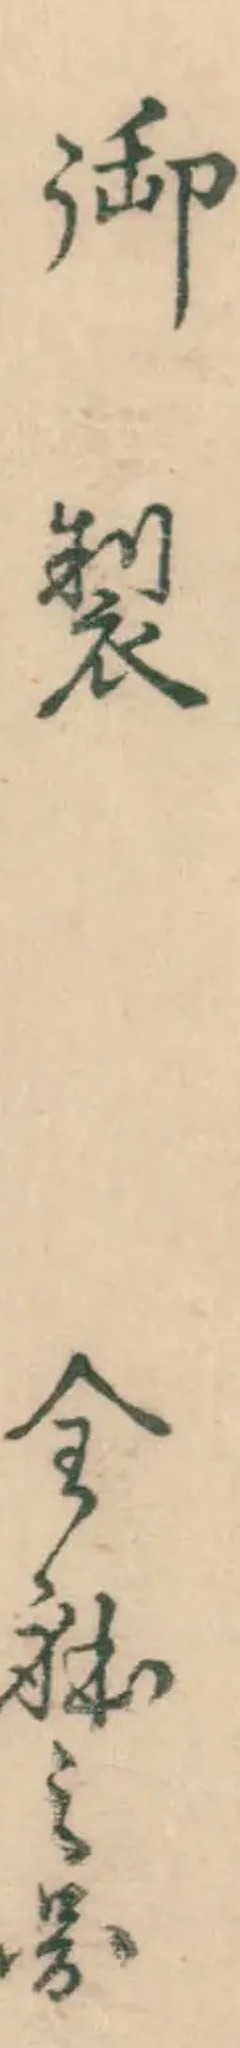御製全体之図
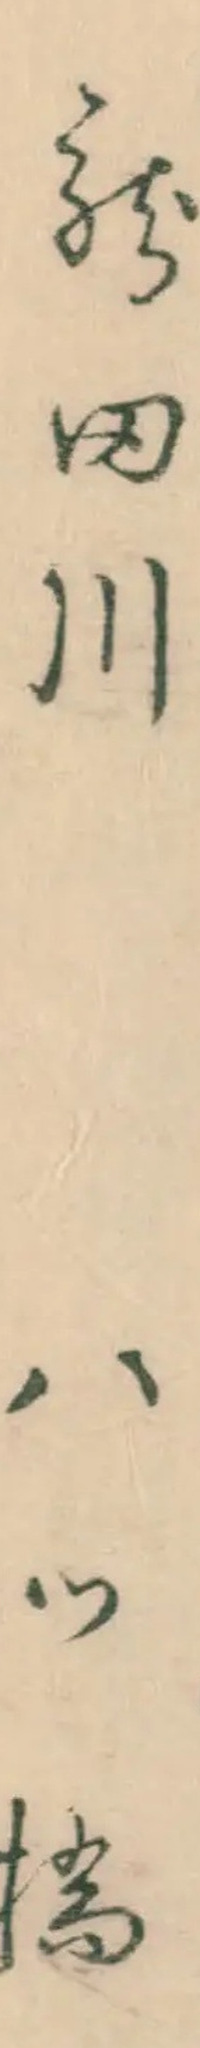龍田川八ツ橋
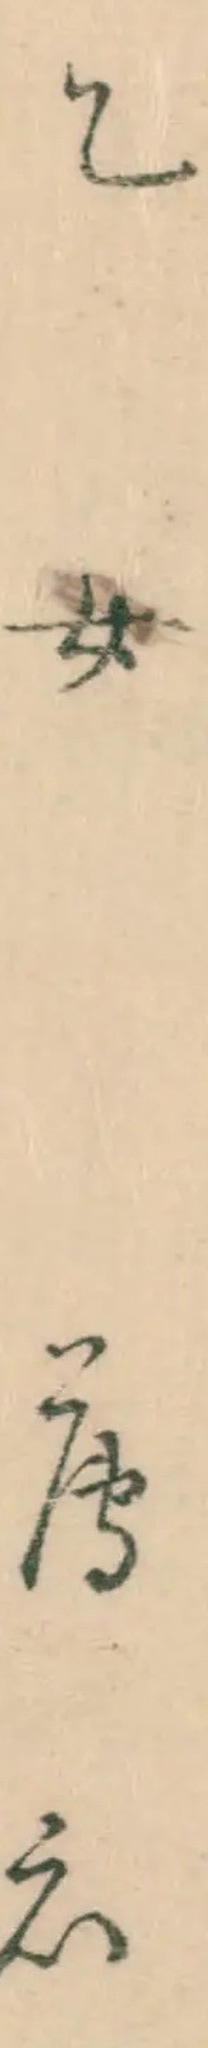乙女薄衣
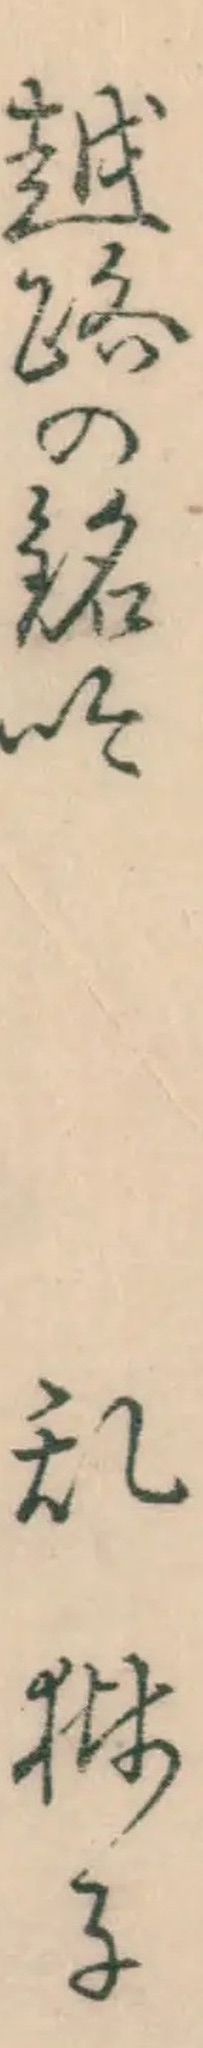越後の銘吟乱獅子
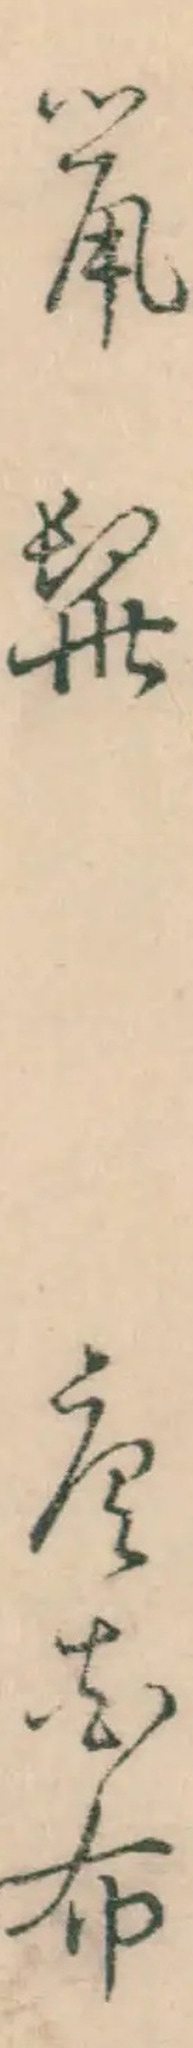鼠髭唐花布
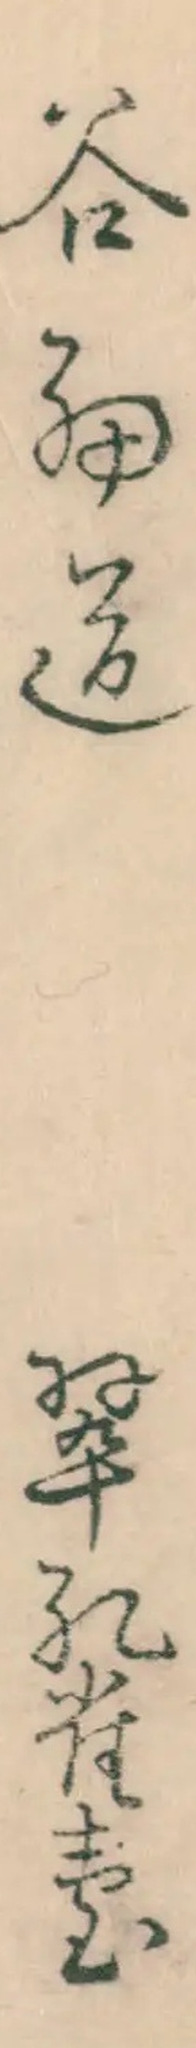谷細道翠孔雀台

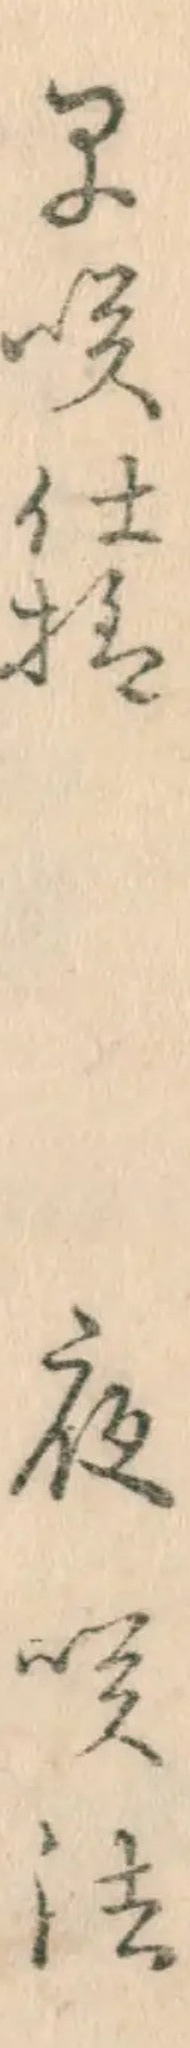早咲仕様夜咲法
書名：花壇朝顔通 2巻. [1]
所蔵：国立国会図書館 National Diet Library, JAPAN
